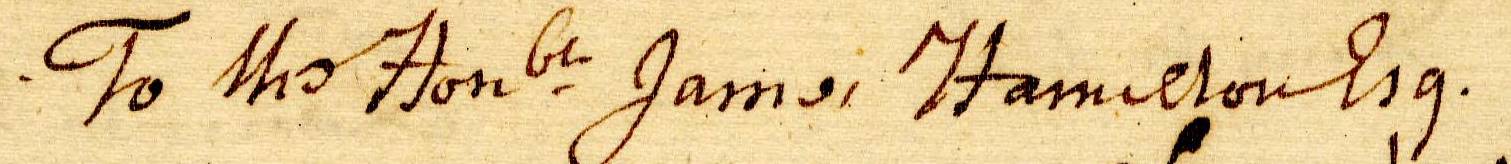To the Hon^ble. James Hamilton Esq.
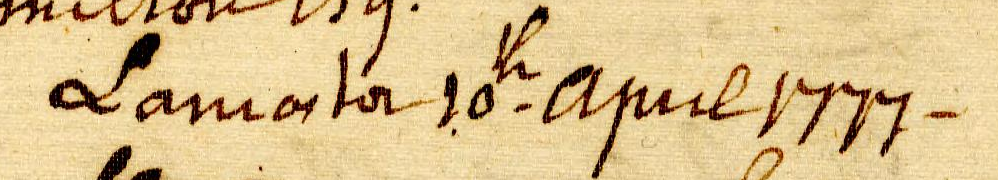Lancaster 10^th. April 1777-
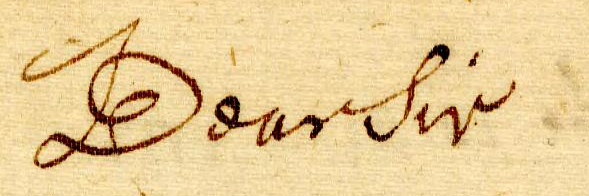Dear Sir
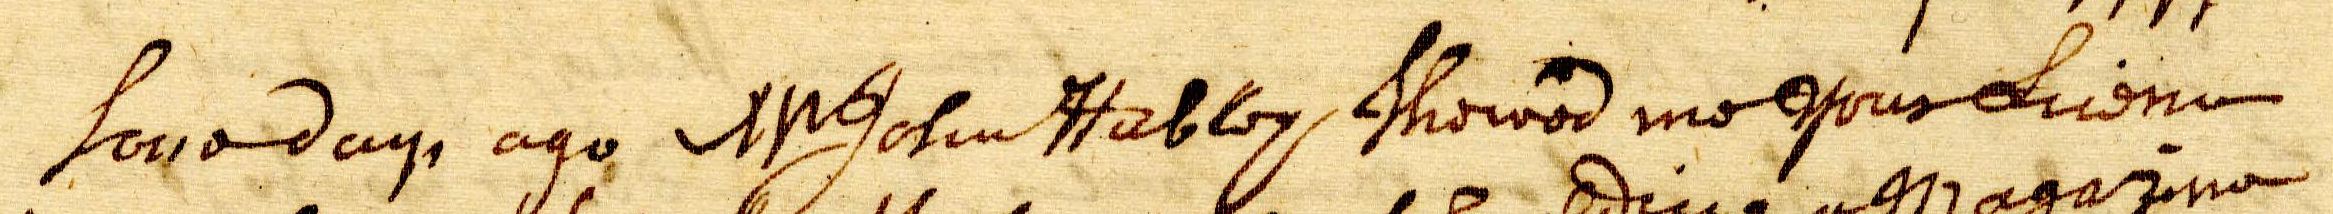Some days ago M^r John Hubly showed me Your Lcience
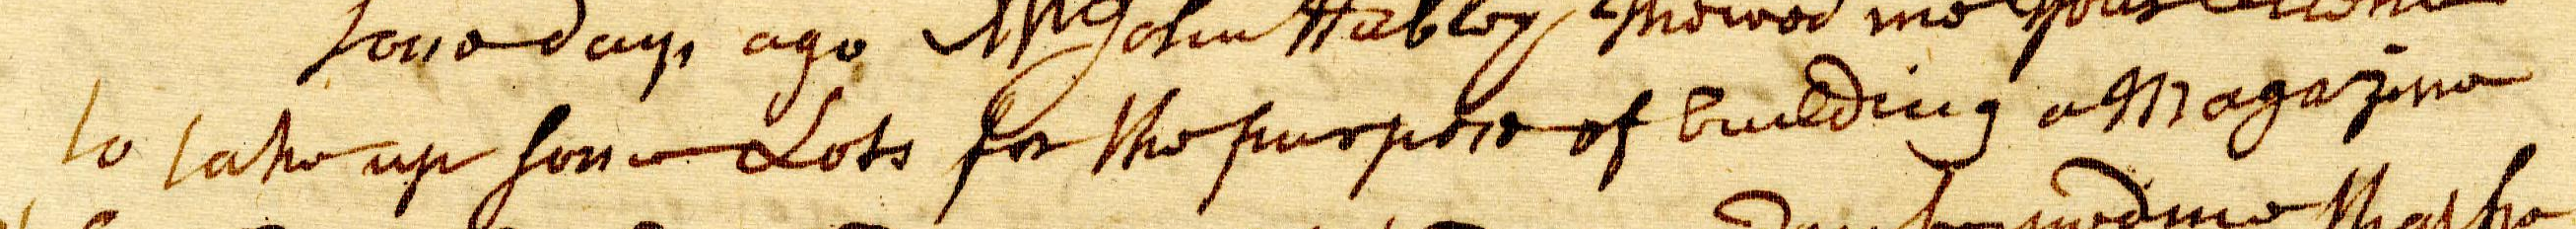to take up sone Lots for the purpose of building a Magazine
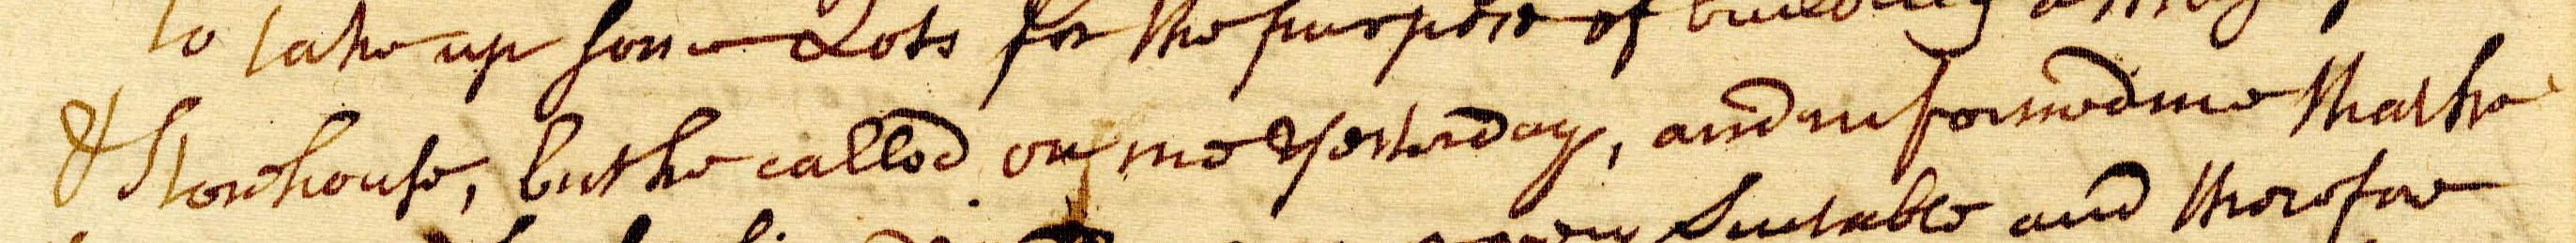& Stowhouse, but he called on me Yesterday, and informed me that he
